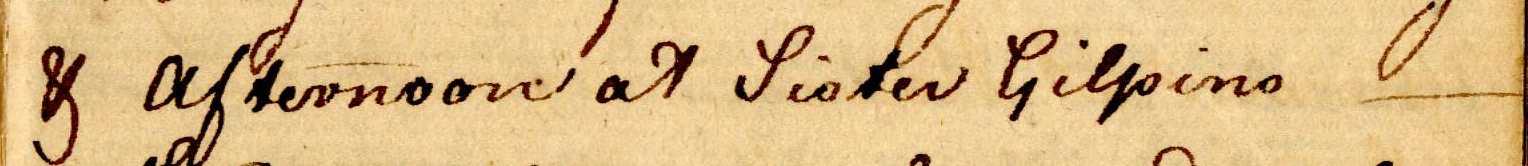& Afternoon at Sister Gilpins-
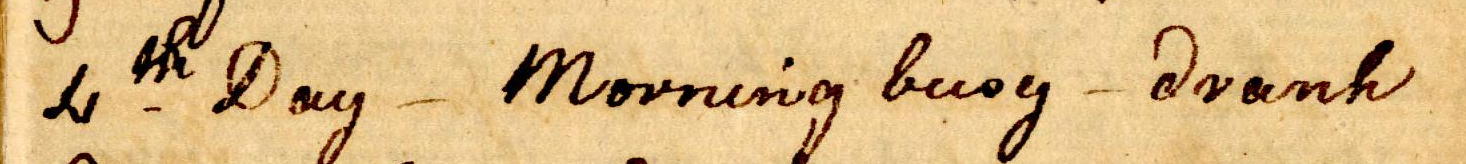4^th Day- Morning busy- drank
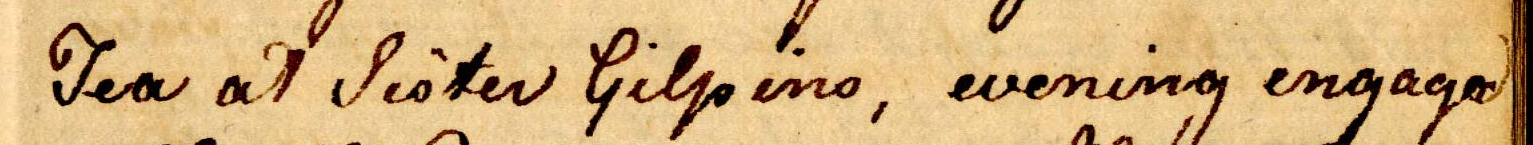Tea at Sister Gilpins, evening engaged
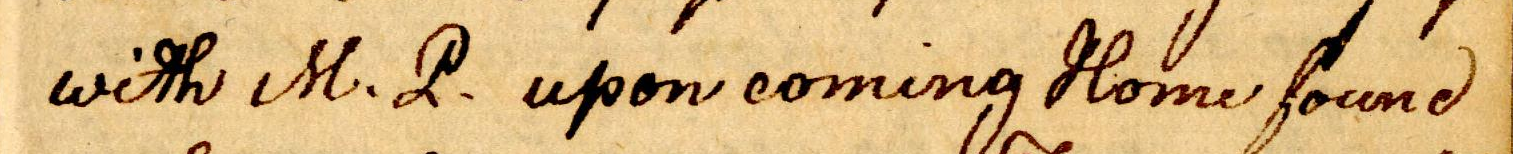with M. P. upon coming Home found
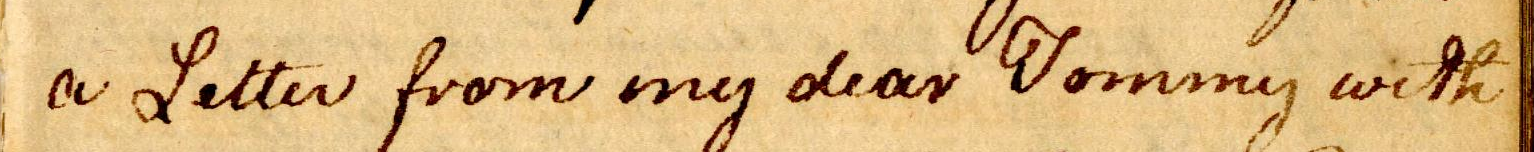a Letter from my dear Tommy with
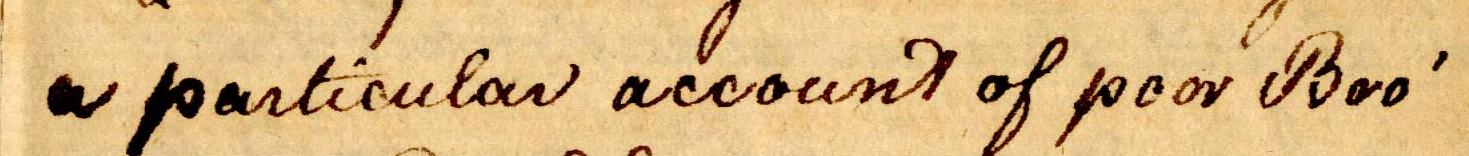a particular account of poor Bro'
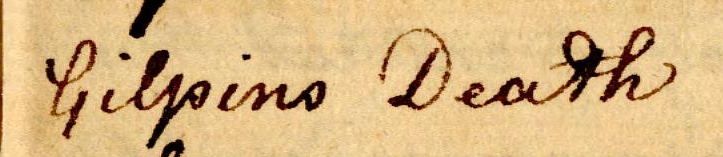Gilpins Death
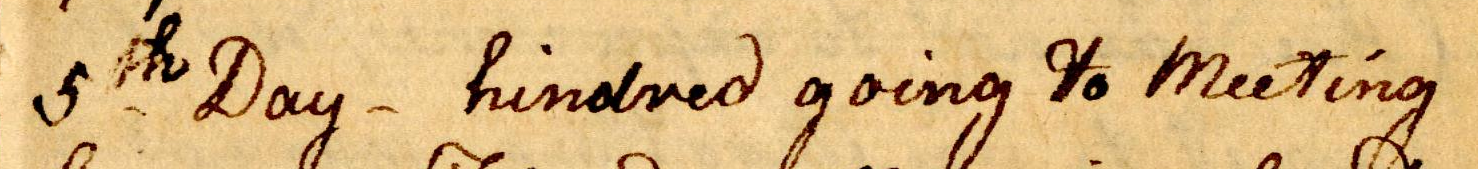5^th Day- hindred going to Meeting
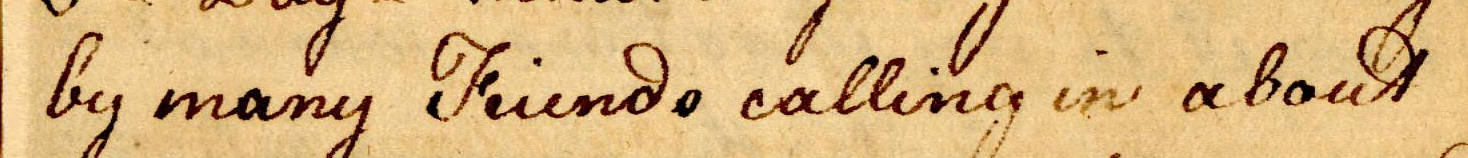by many Friends calling in about
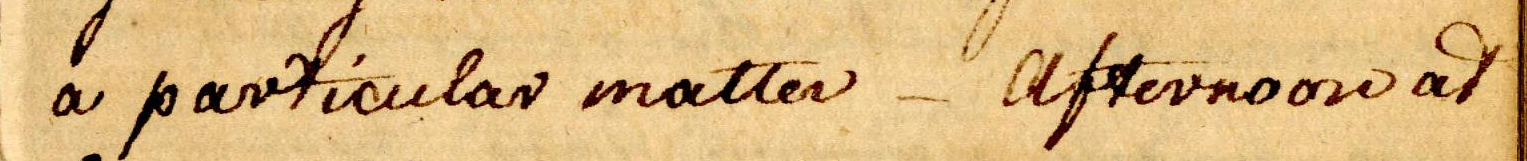a particular matter,- Afternoon at
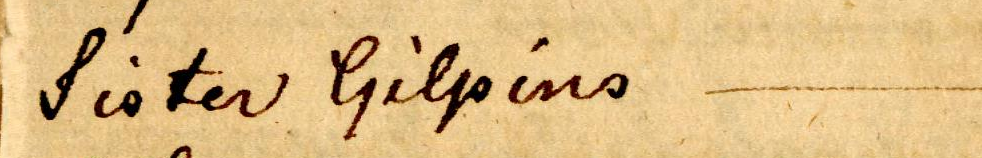Sister Gilpins-
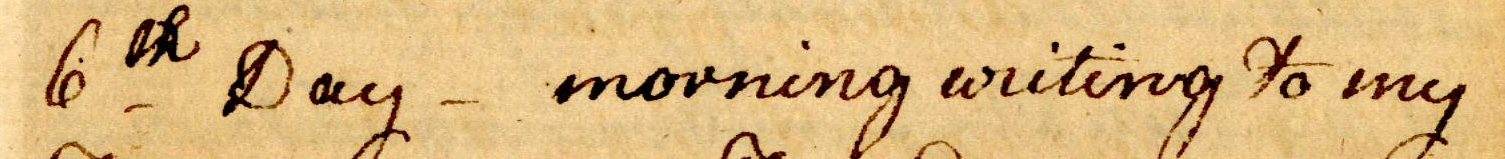6^th- Day- morning writing to my
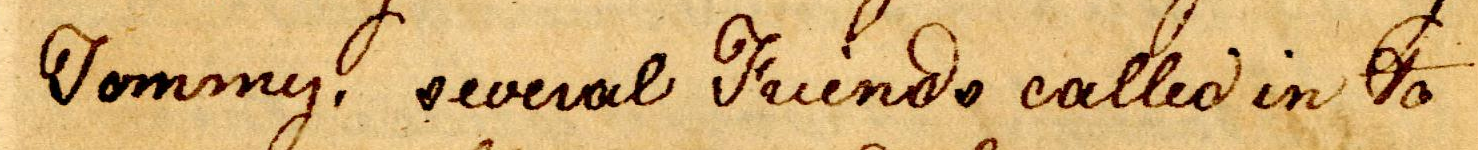Tommy, several Friends called in to
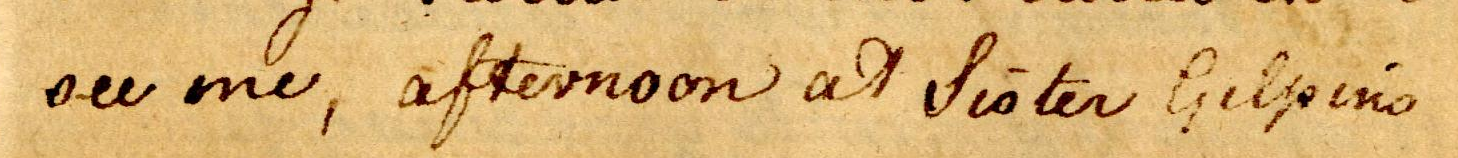see me, afternoon at Sister Gilpins
